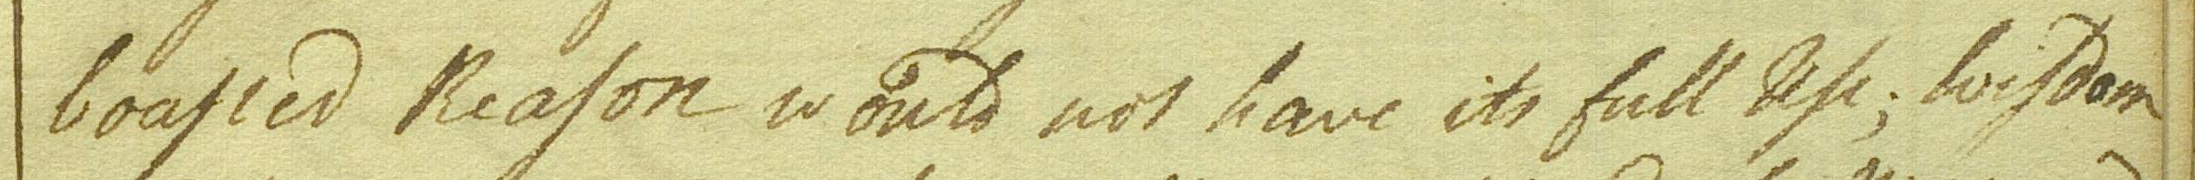boasted Reason would not have its full life; Wisdom
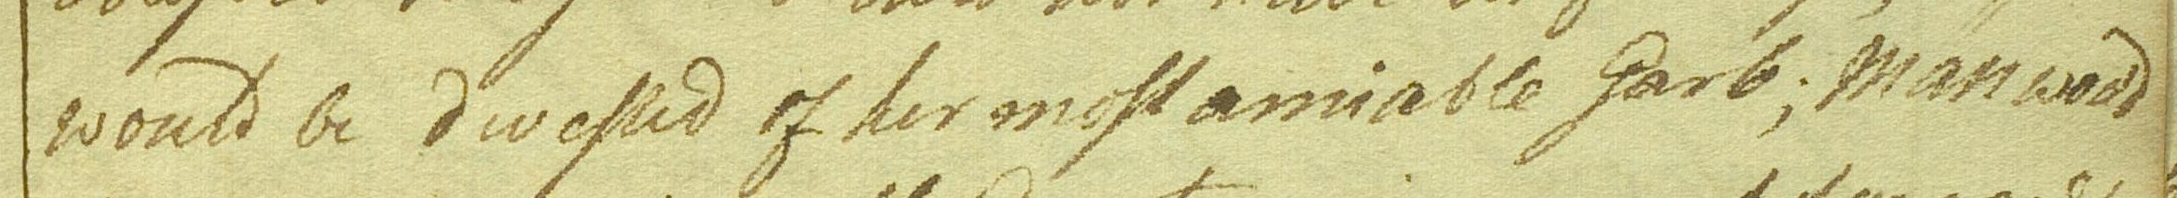would be divested of her most amiable garb; Man would
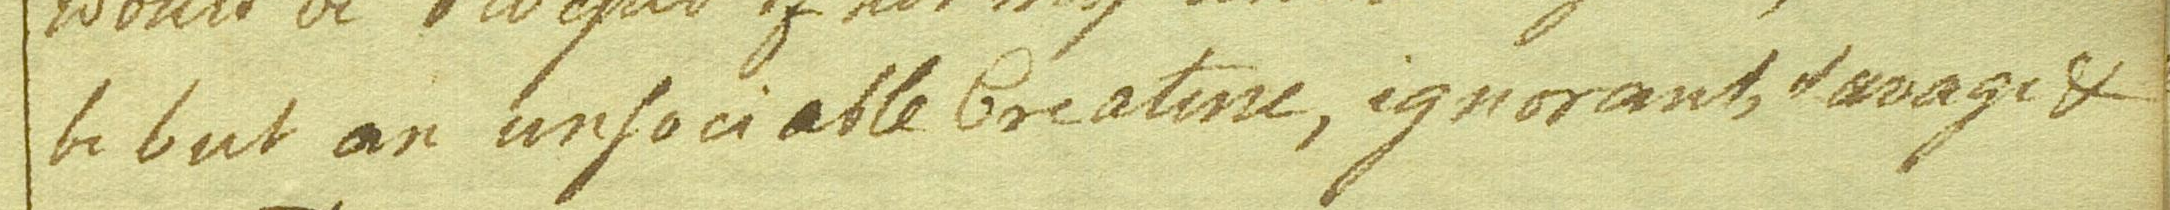be but an unsociable Creature, ignorant, savage &
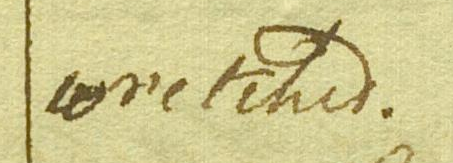wretched.
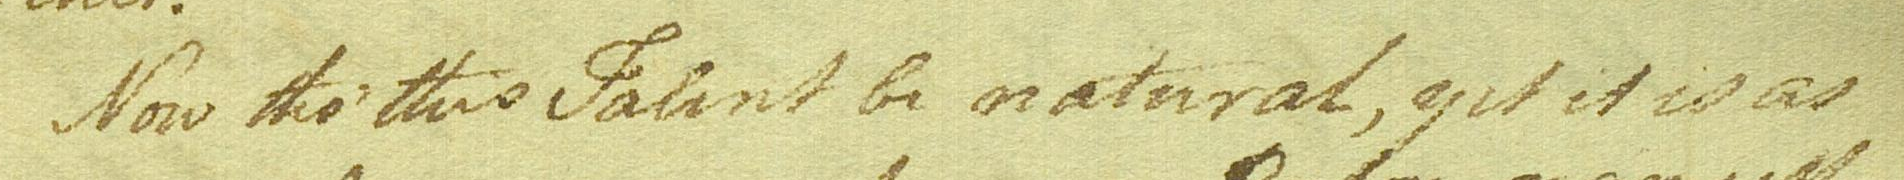Now tho' this Talent be natural, yet it is as
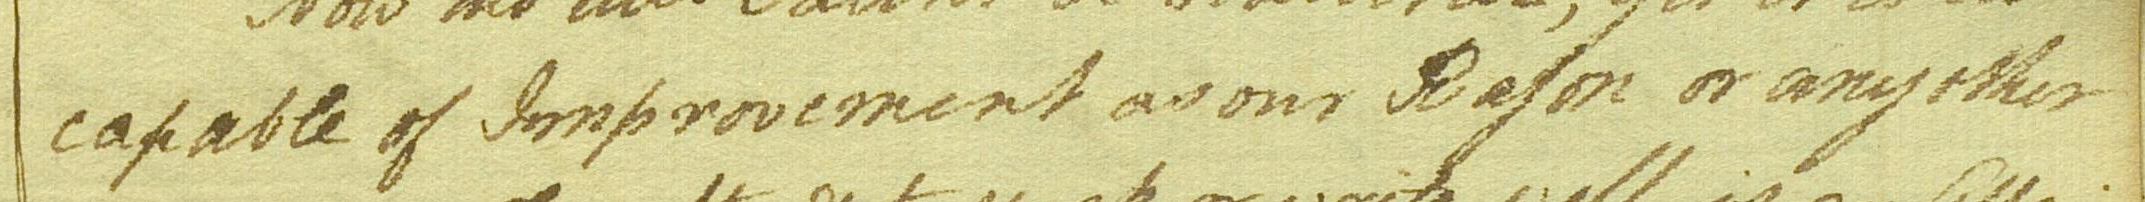capable of Improvement as our Reason or any other
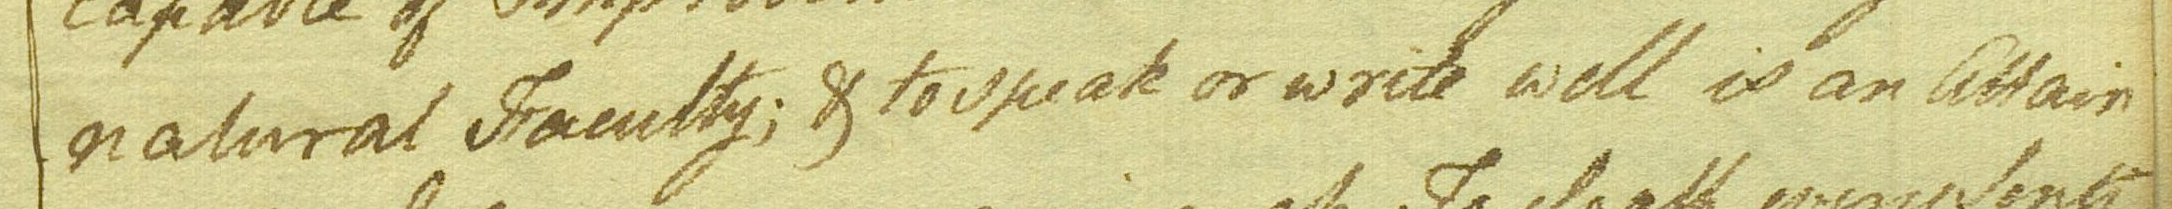natural Faculty; & to speak or write well is an Attain
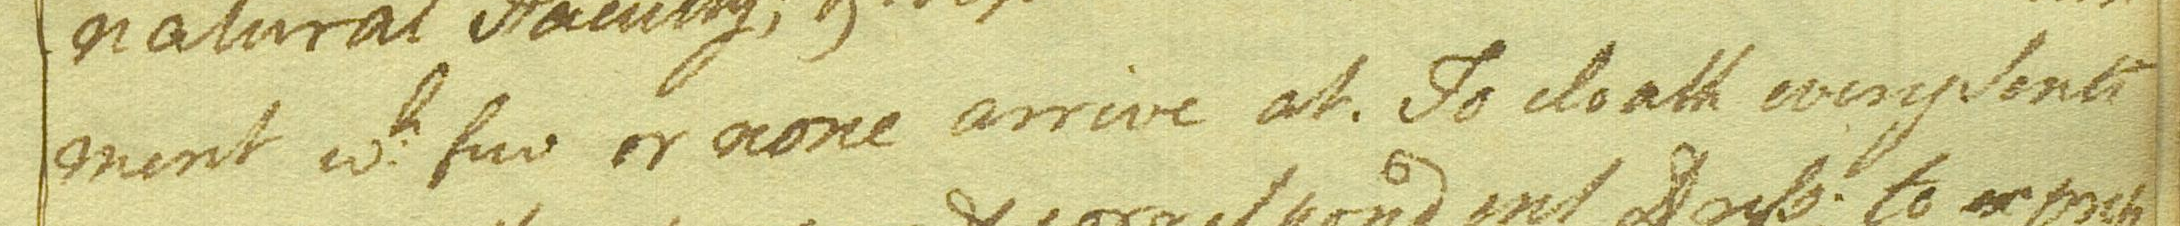ment w^h: few or none arrive at. To cloath every senti
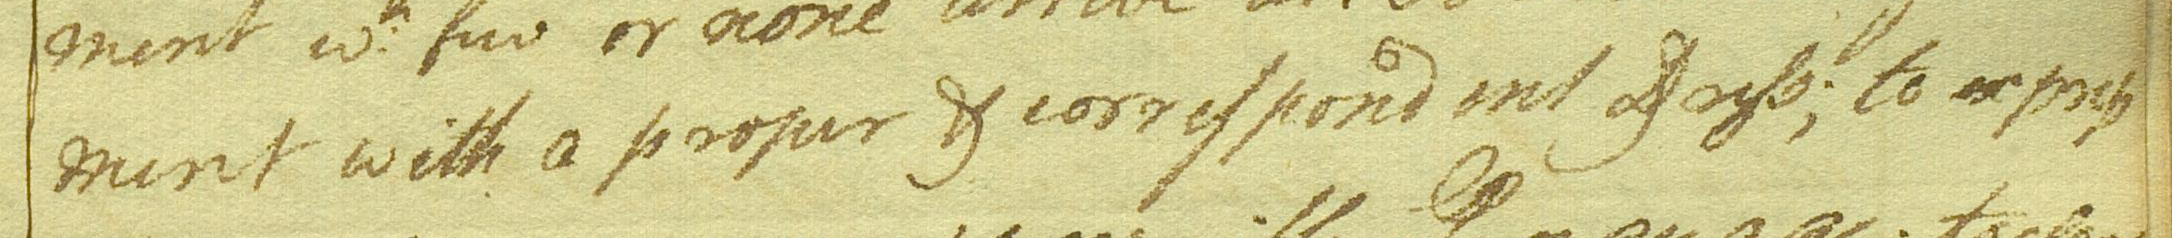ment with a proper & correspondent Days; to express
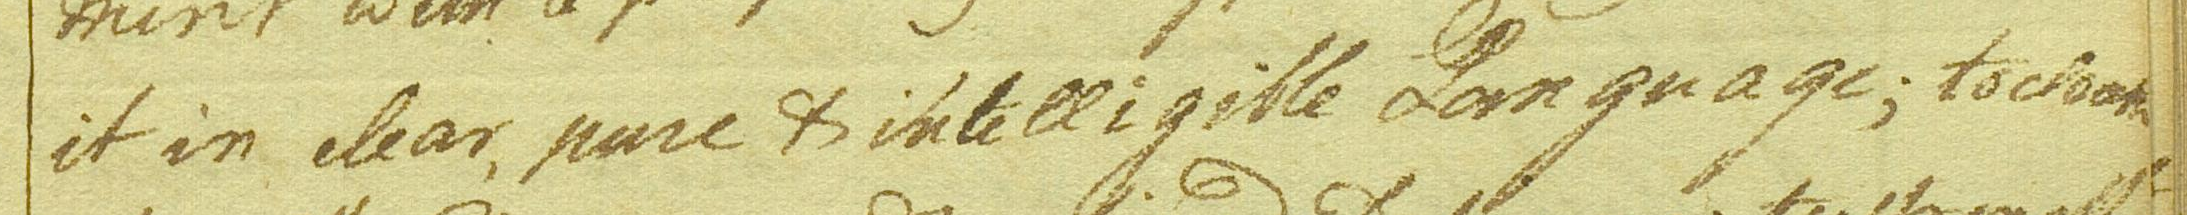it in clear, pure & intelligible Language; to cloak
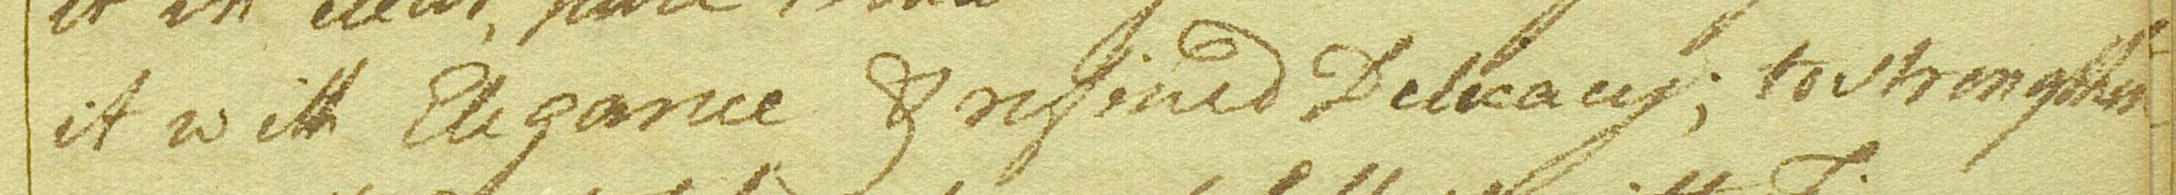it with Elegance & refined Delicacy; to strengthen
